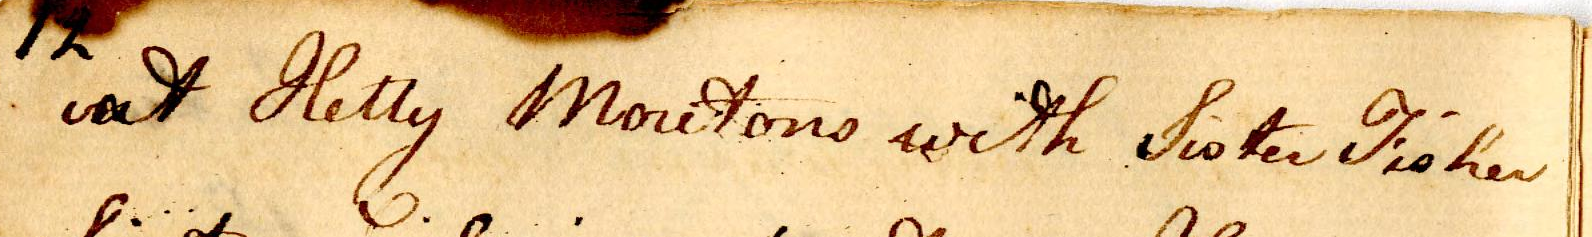at Hetty Moretons with Sister Fisher
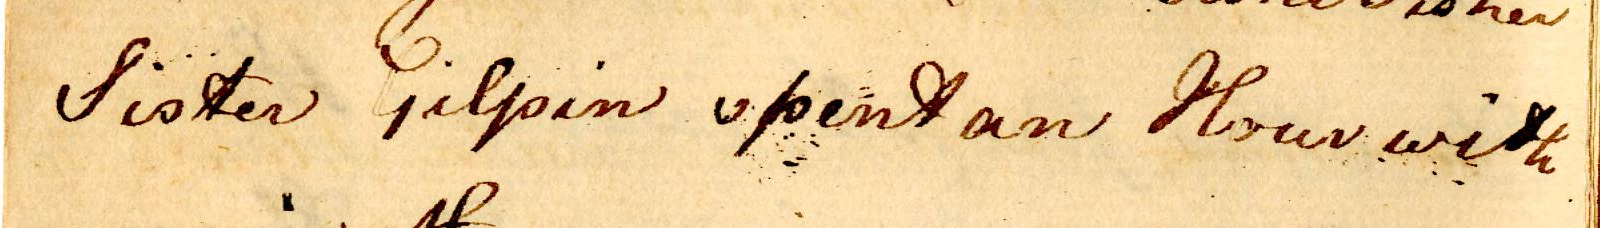Sister Gilpin spent an Hour with
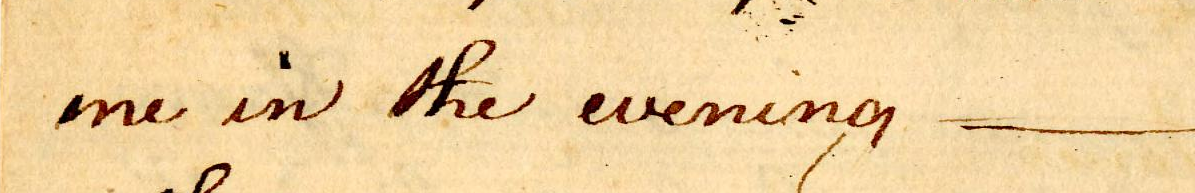me in the evening-
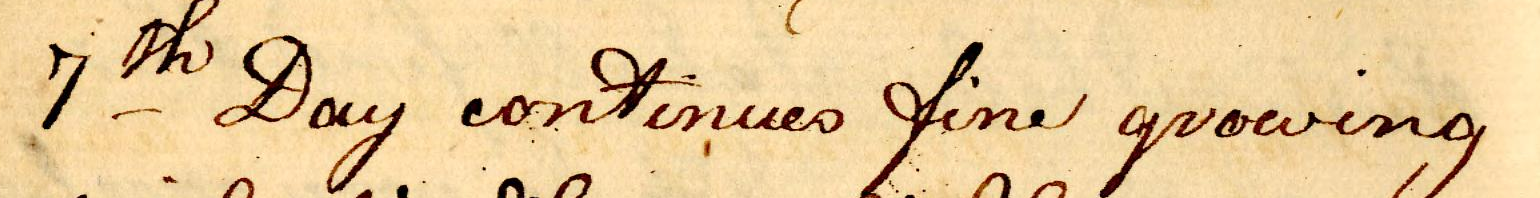7^th Day continues fine growing
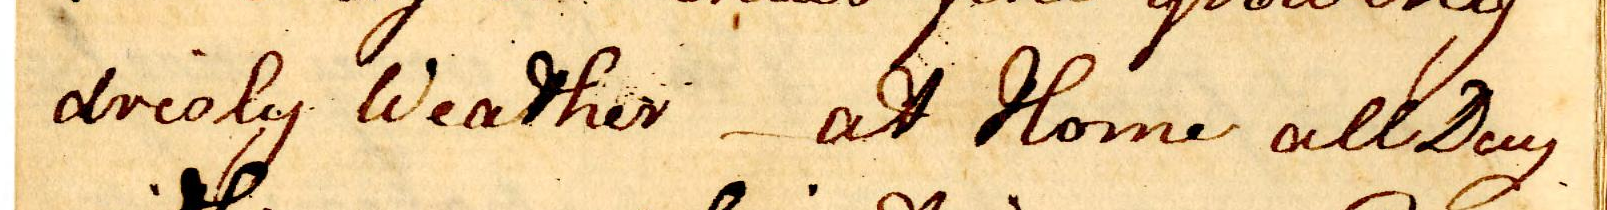drisly Weather- at Home all Day
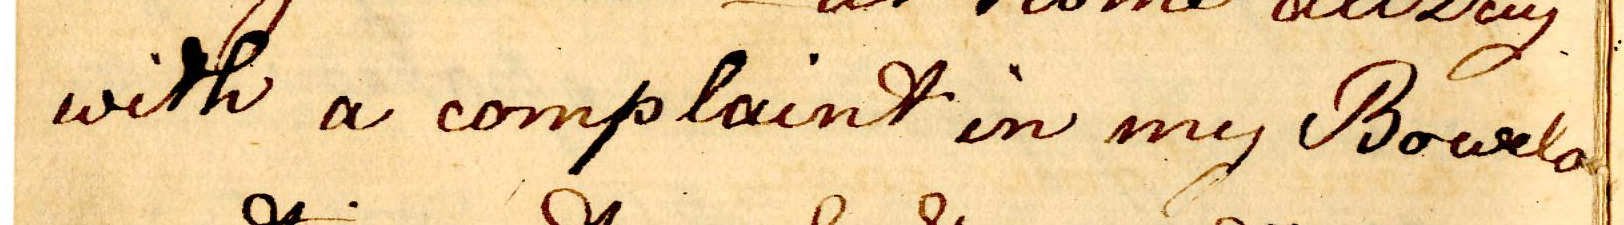with a complaint in my Bowels
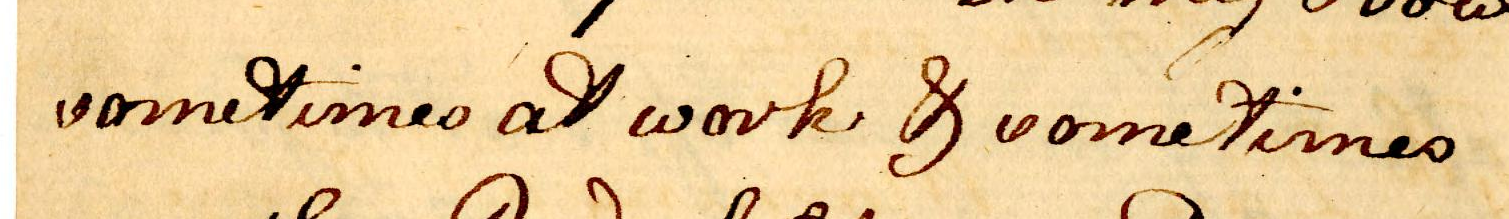sometimes at work & sometimes
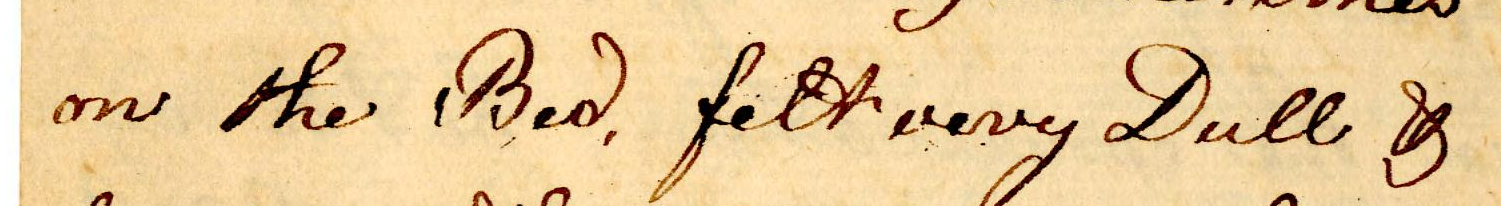on the Bed, felt very Dull &
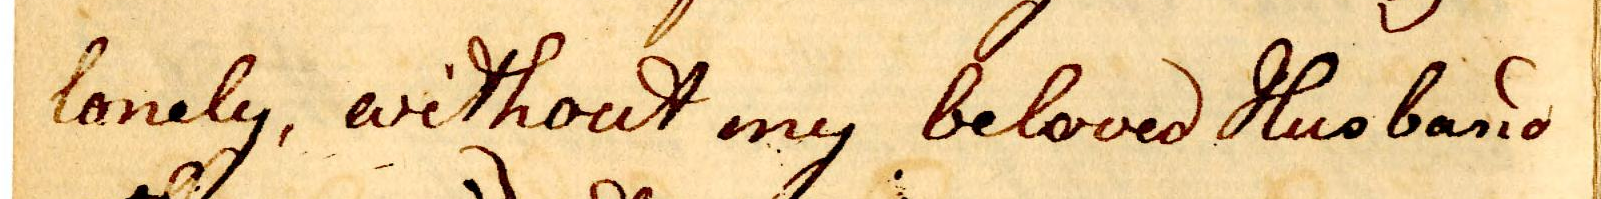lonely, without my beloved Husband
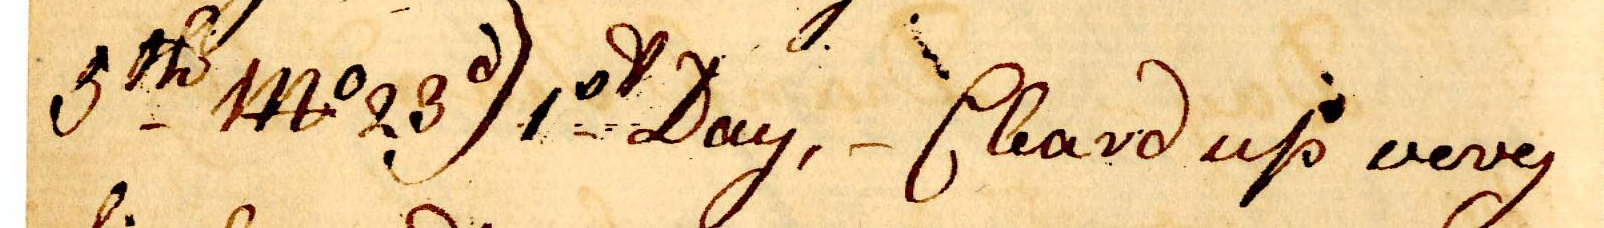5^th M^o 23^d) 1^st Day,- Cleard up very
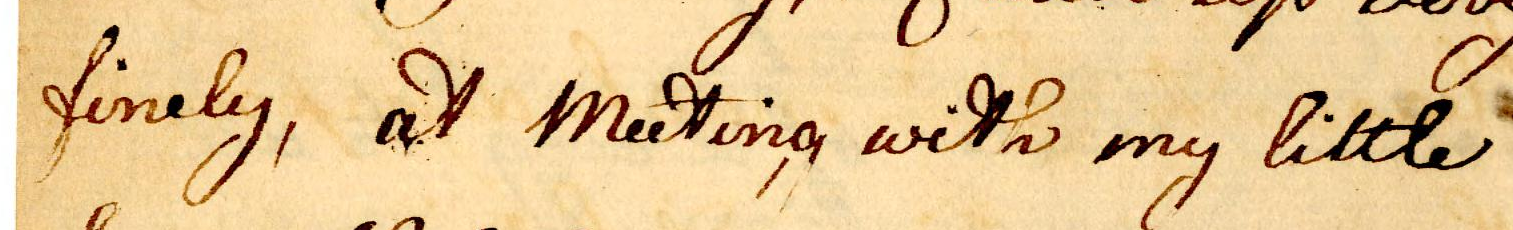finely, at Meeting with my little
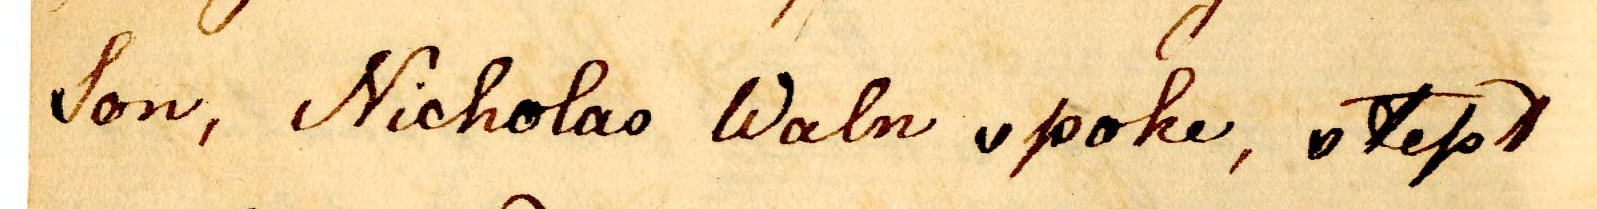Son, Nicholas Waln spoke, stept
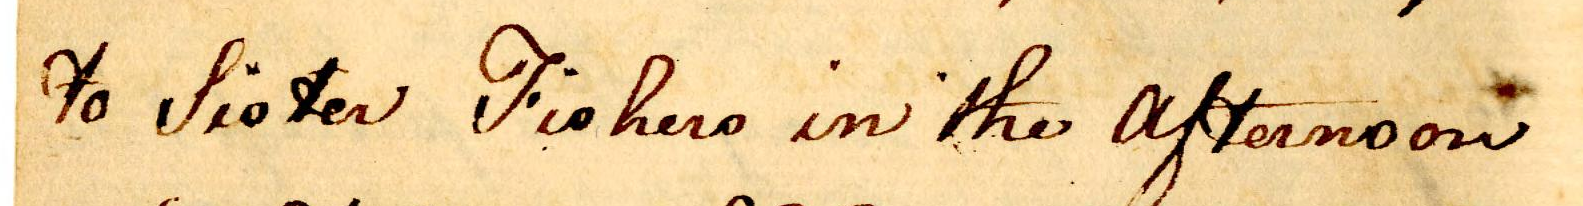to Sister Fishers in the Afternoon
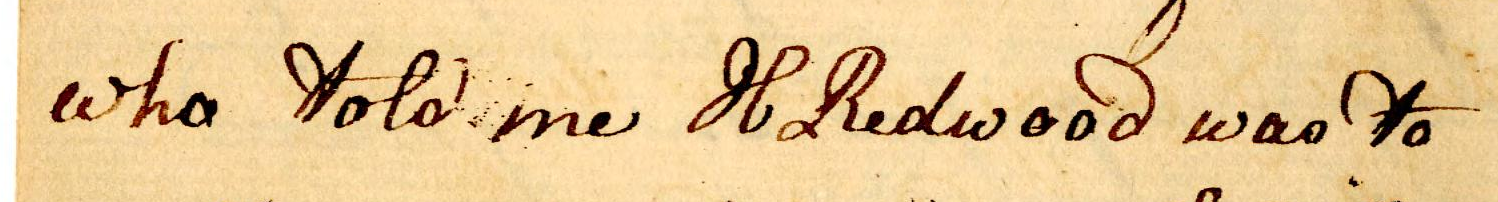who told me H Redwood was to
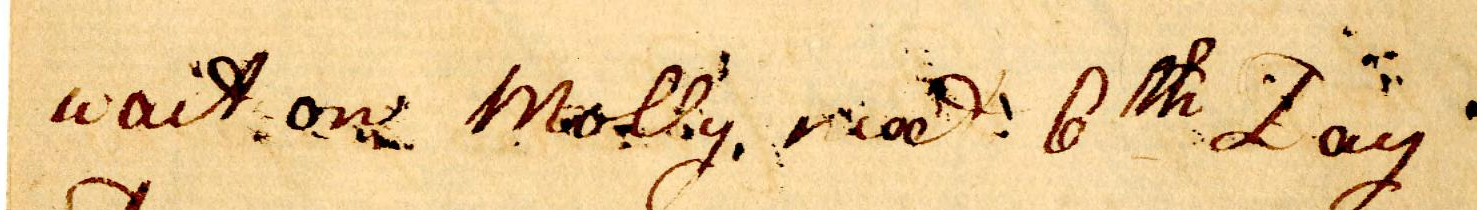wait on Molly recd 6^th Day
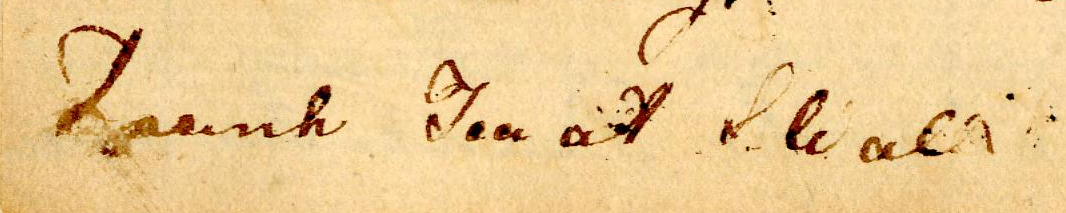drunk Tea at S. Waln
